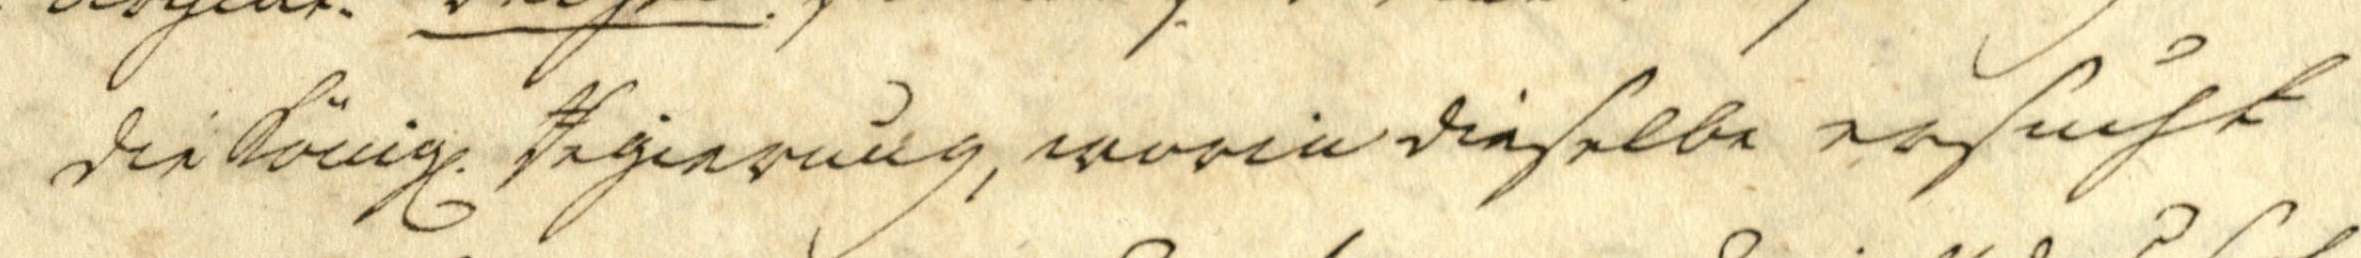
die Königl. Regierung, worin dieselbe ersucht
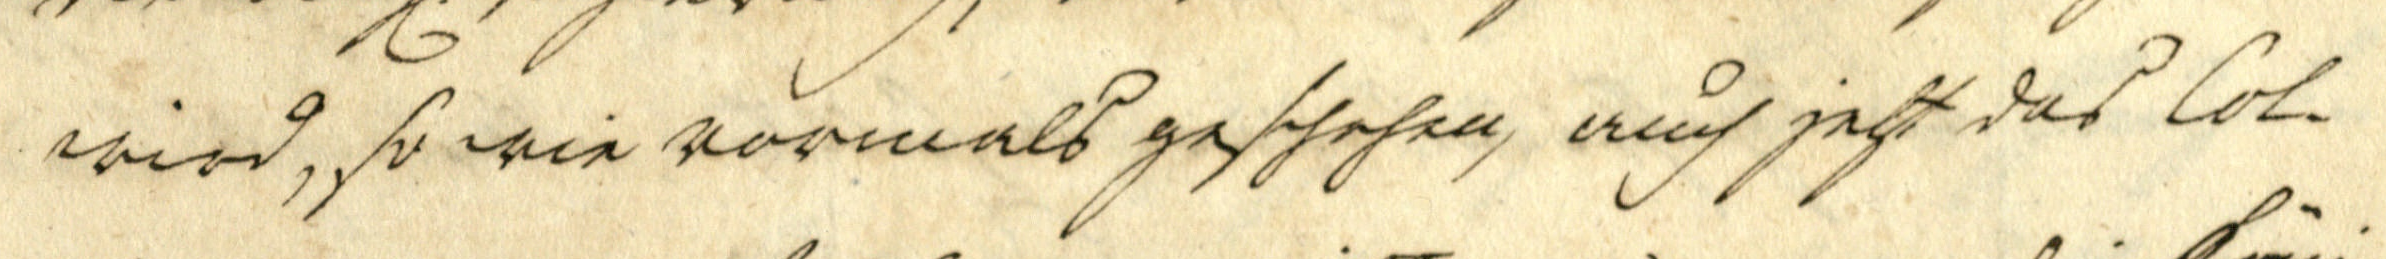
wird, so wie vormals geschehen, auch jetzt das Col¬
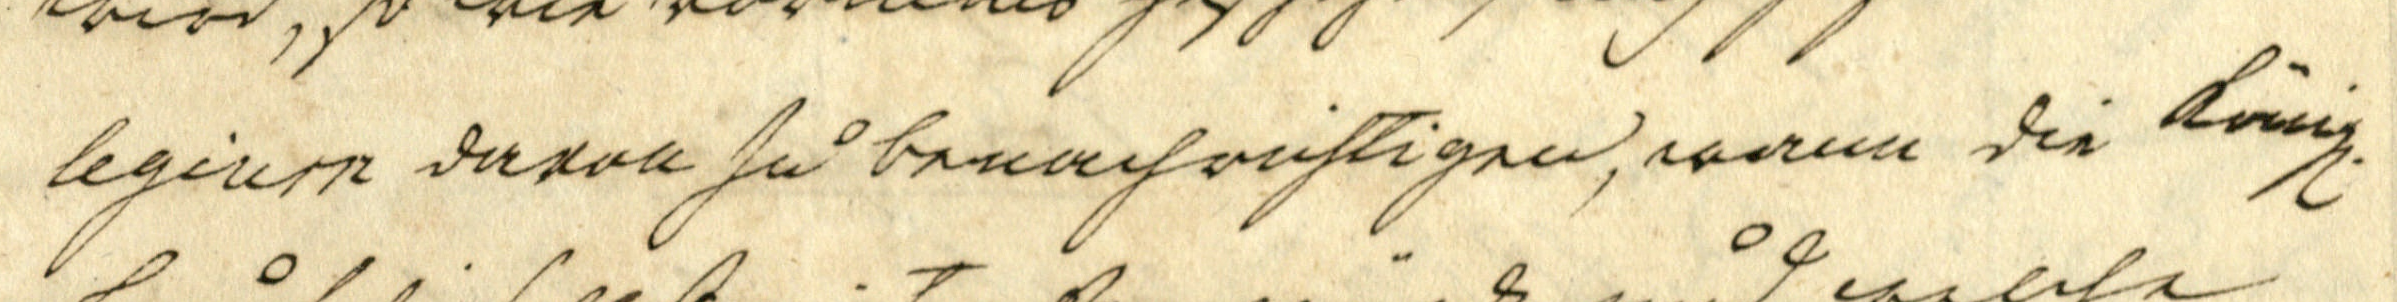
legium davon zu benachrichtigen, wann die Königl.
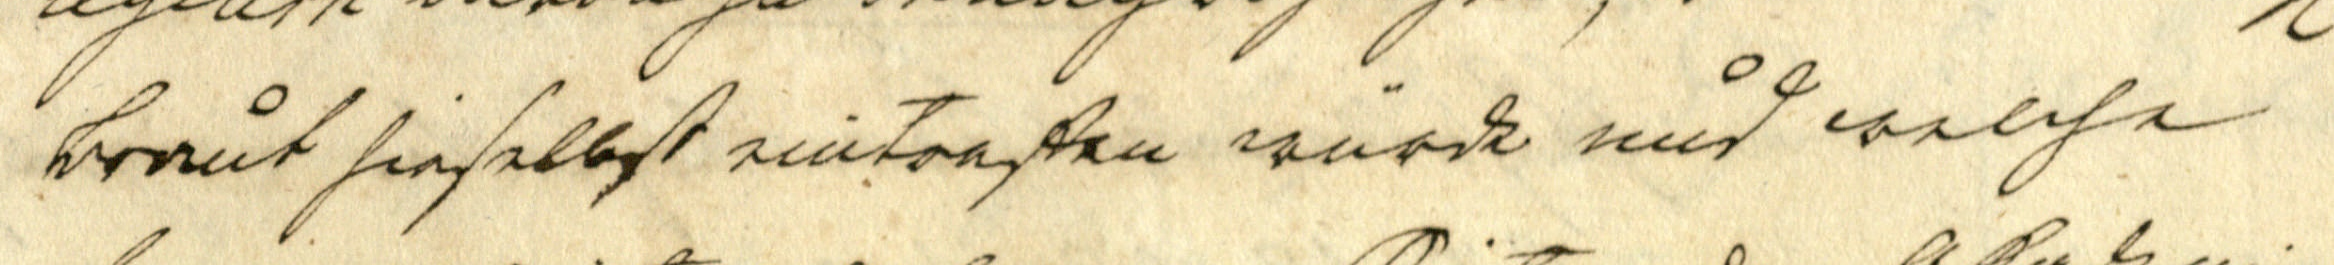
Braut hieselbst eintreffen würde und welche
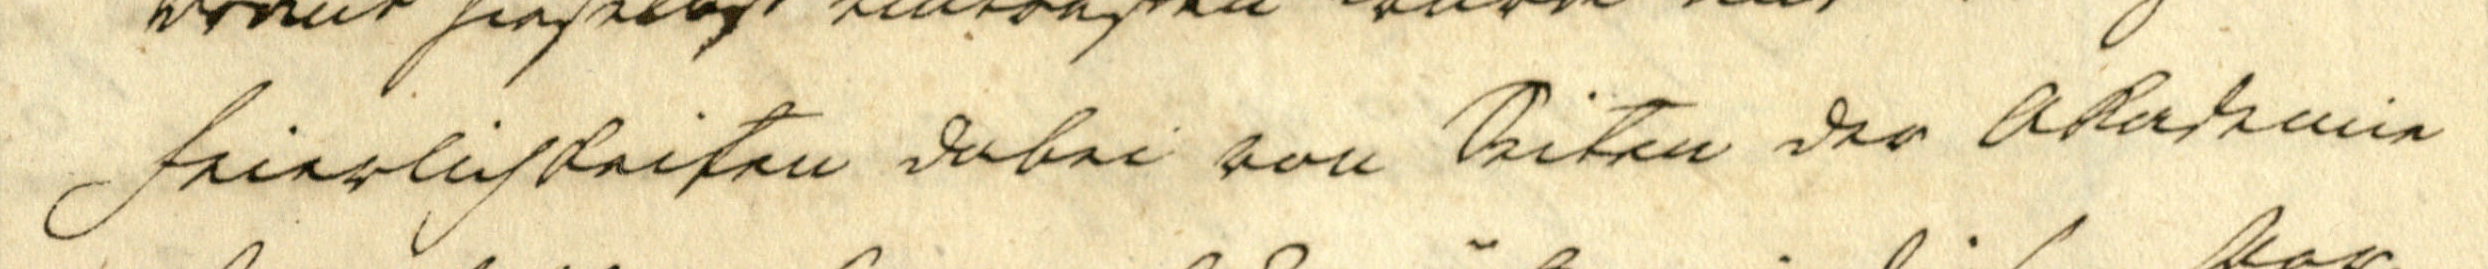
Feierlichkeiten dabei von Seiten der Akademie
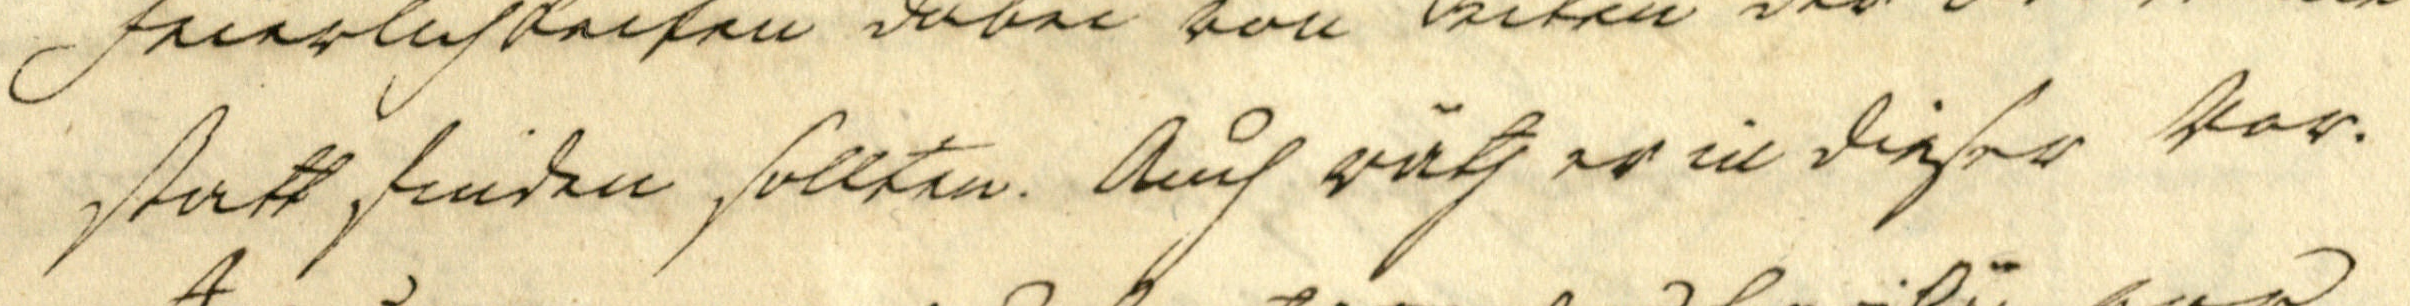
statt finden sollten. Auch räth er in dieser Vor¬
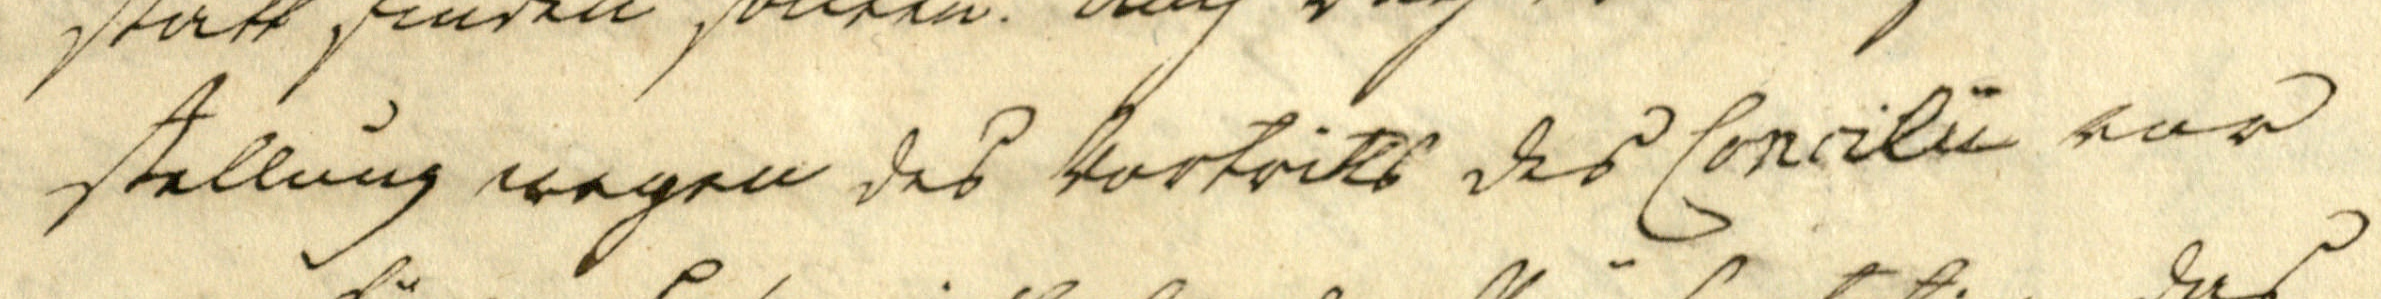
stellung wegen des Vortritts des Concilii vor
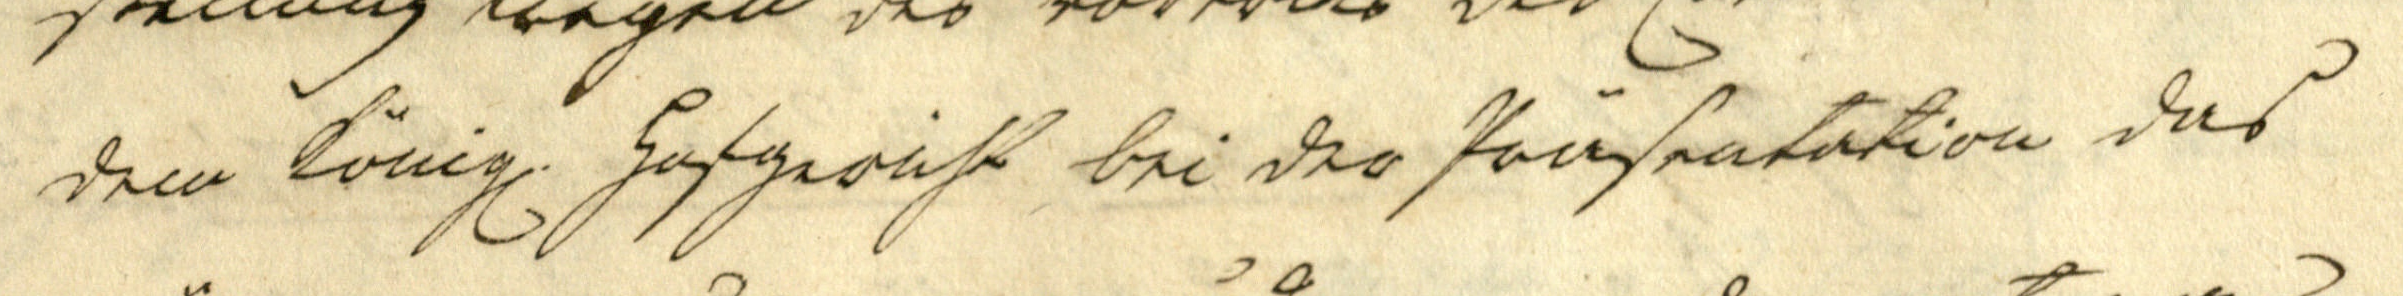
dem Königl. Hofgericht bei der Präsentation das
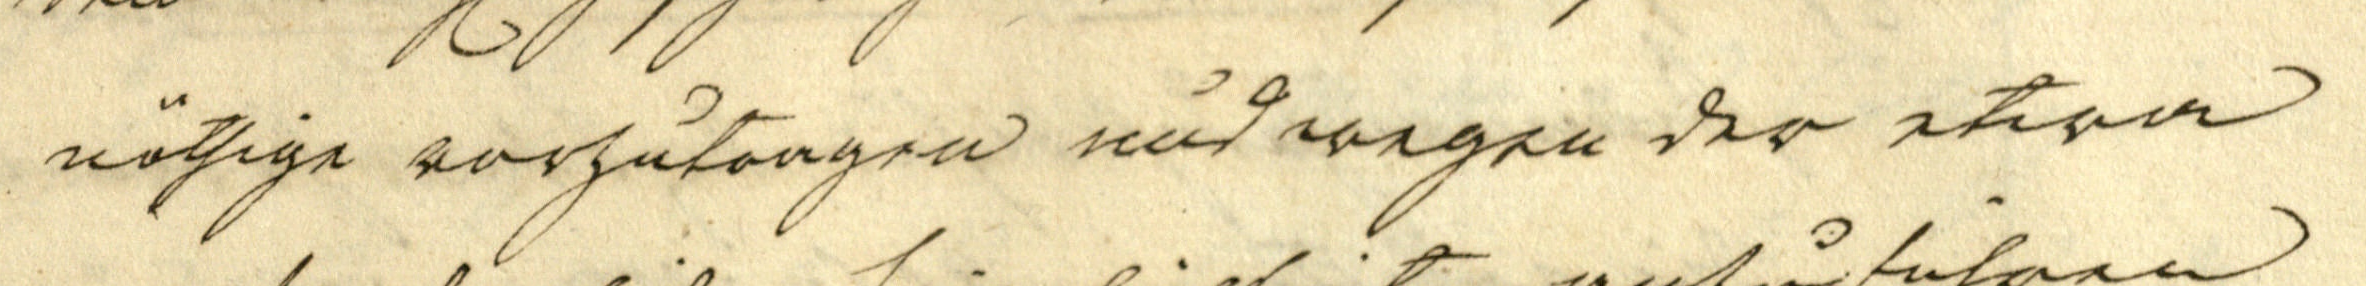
nöthige vorzutragen und wegen der etwa
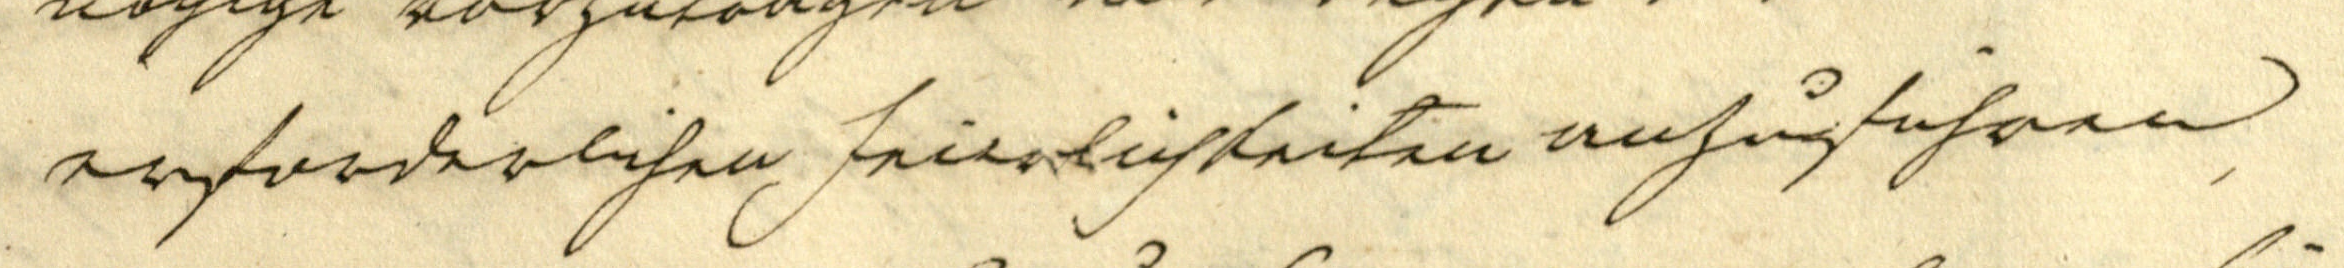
erforderlichen Feierlichkeiten anzuführen,
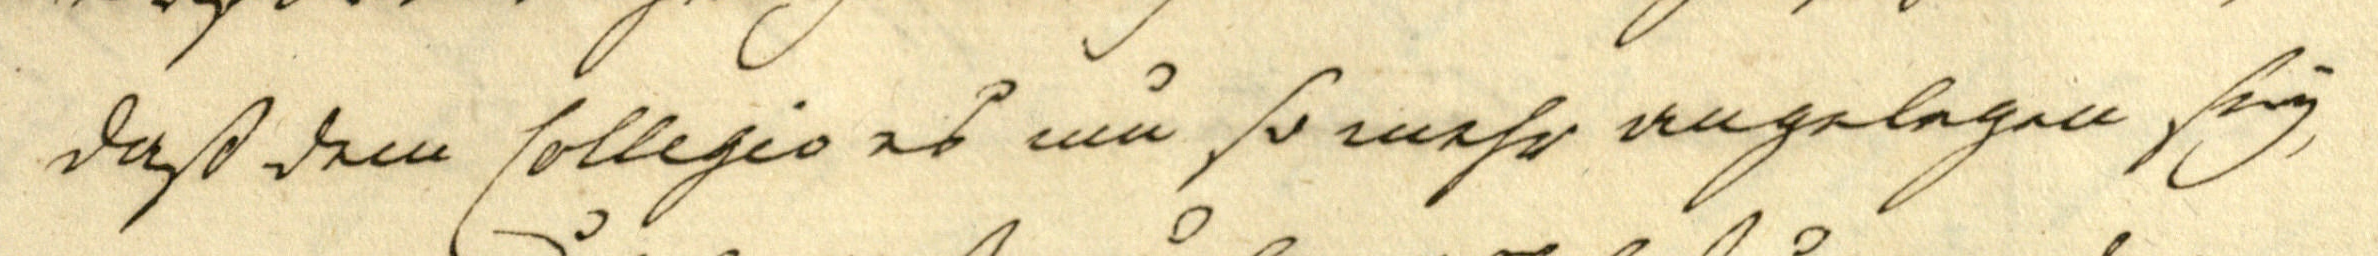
daß dem Collegio es um so mehr angelegen seÿ,
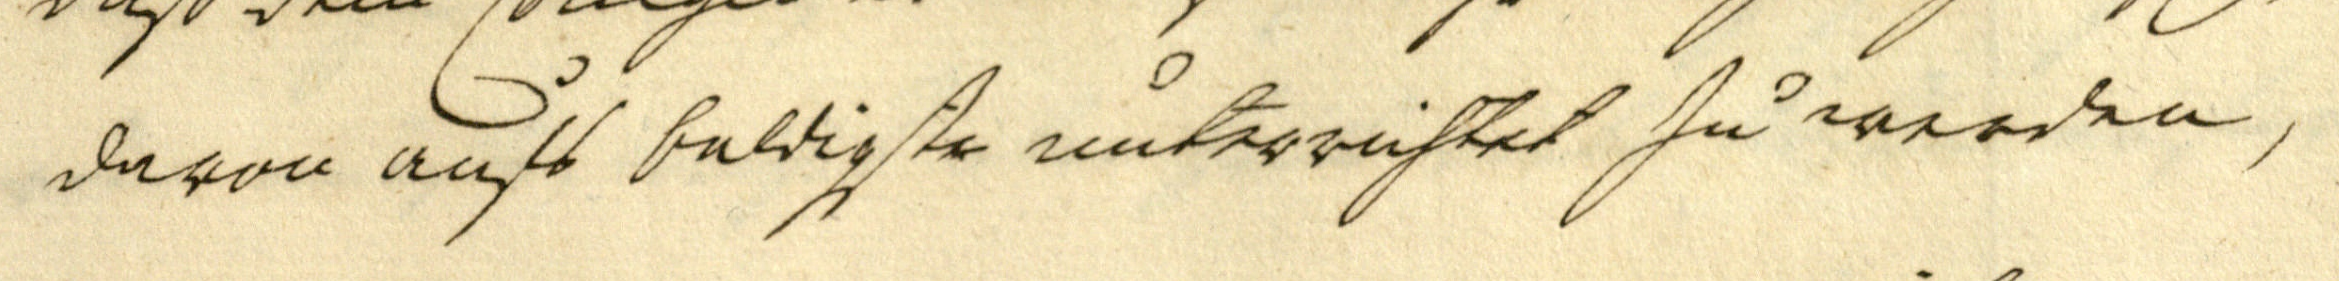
davon aufs baldigste unterrichtet zu werden,
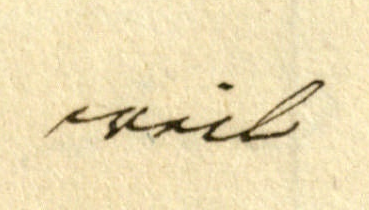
weil
